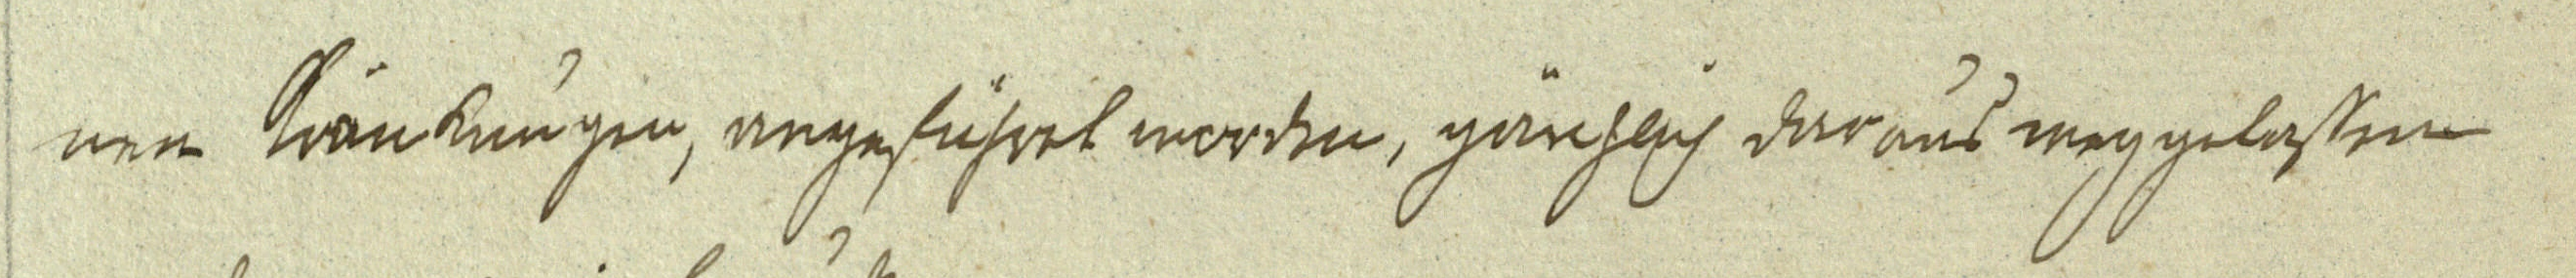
nen Kränkungen, angeführet worden, gänzlich daraus weggelassen
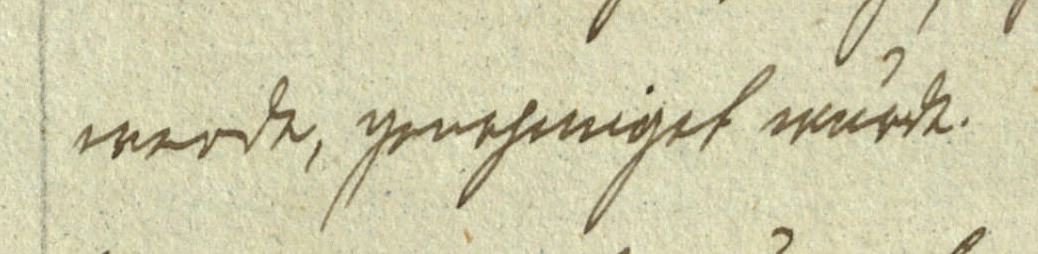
werde, genehmiget wurde.
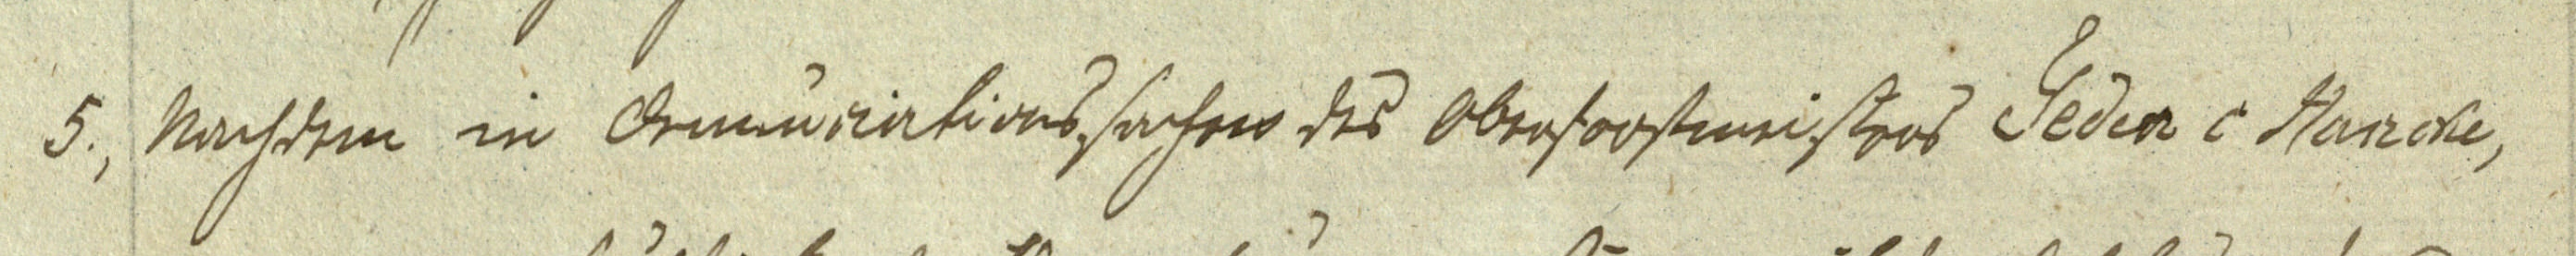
5., Nachdem in Denunciationssachen des Oberforstmeisters Teden c Hancke,
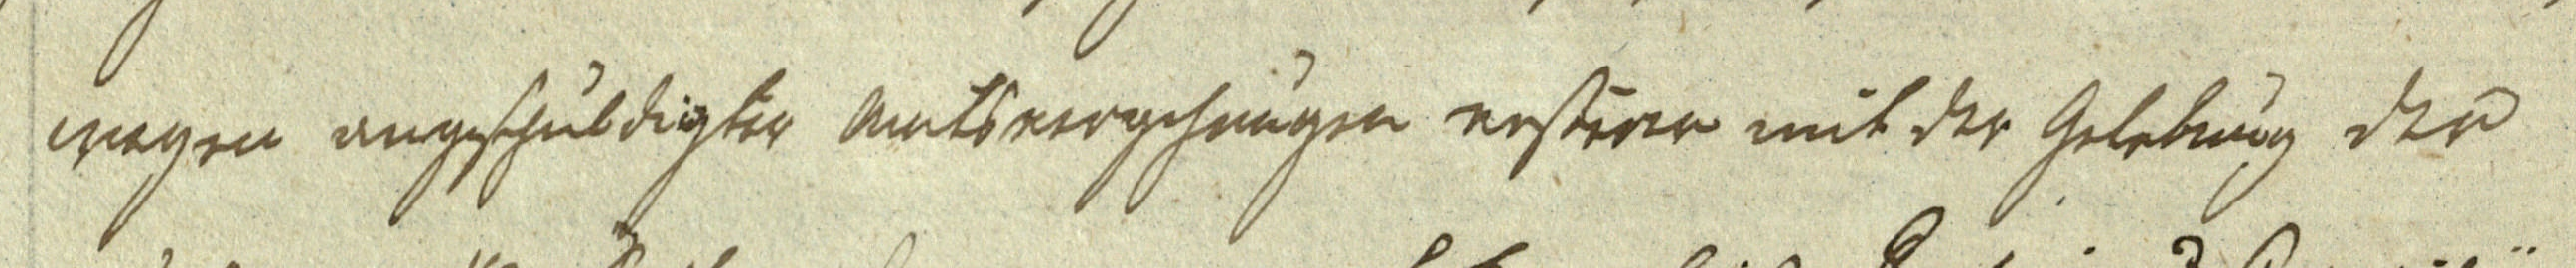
wegen angeschuldigter Amtsvergehungen ersterer mit der Gelebung der
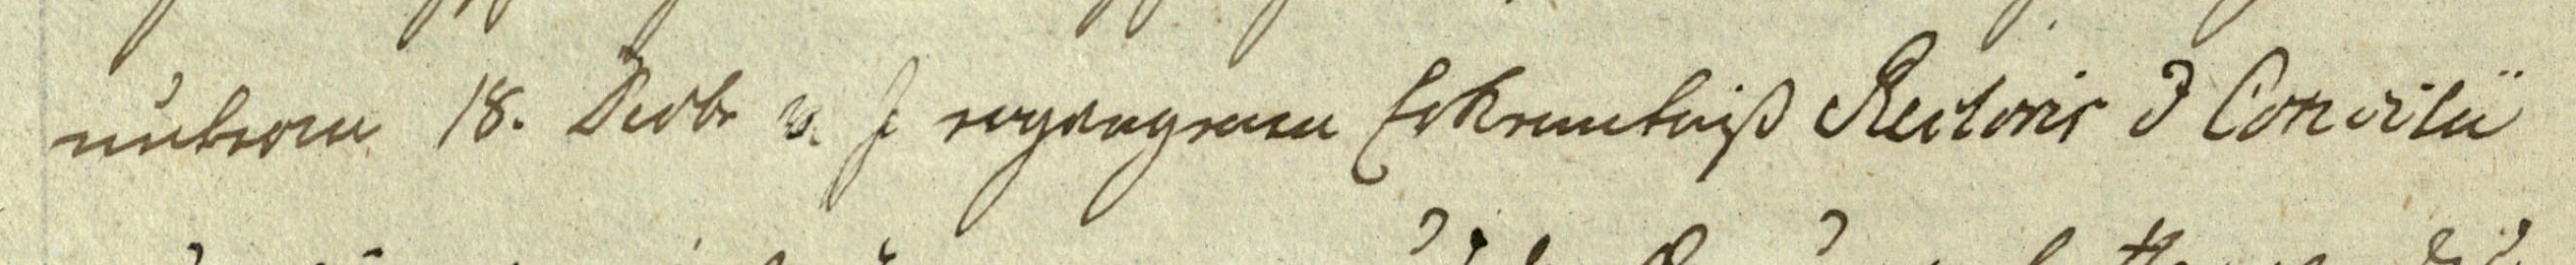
unterm 18. Decbr v. J. ergangenen Erkenntniß Rectoris et Concilii
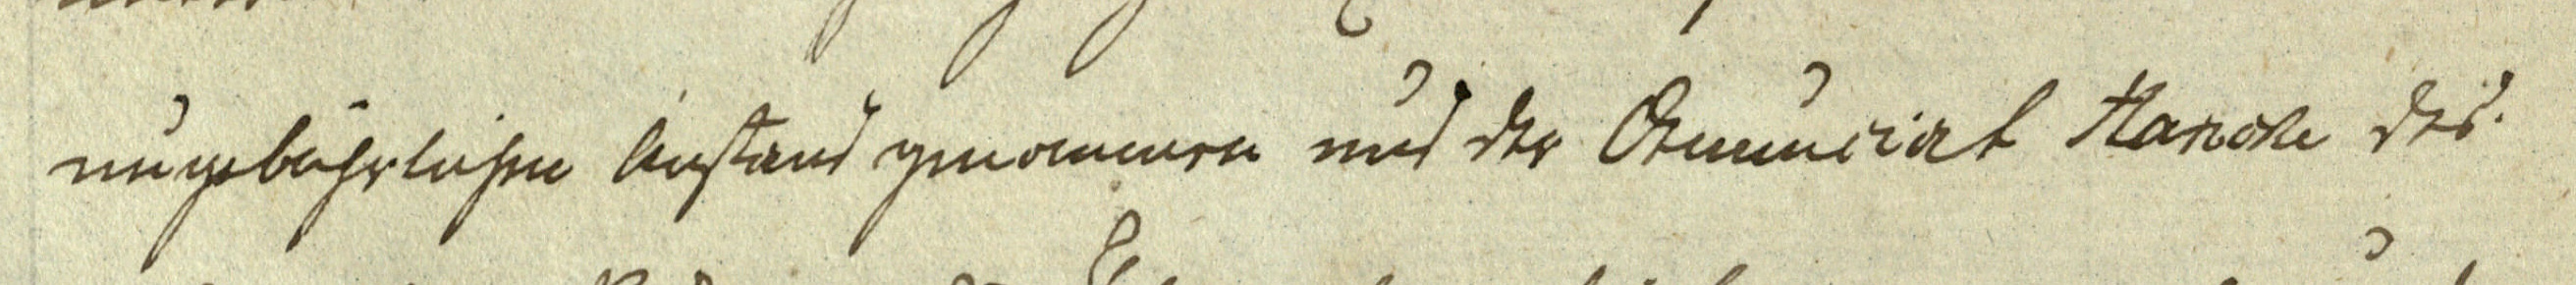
ungebührlichen Anstand genommen und der Aemumciat Hancke des¬
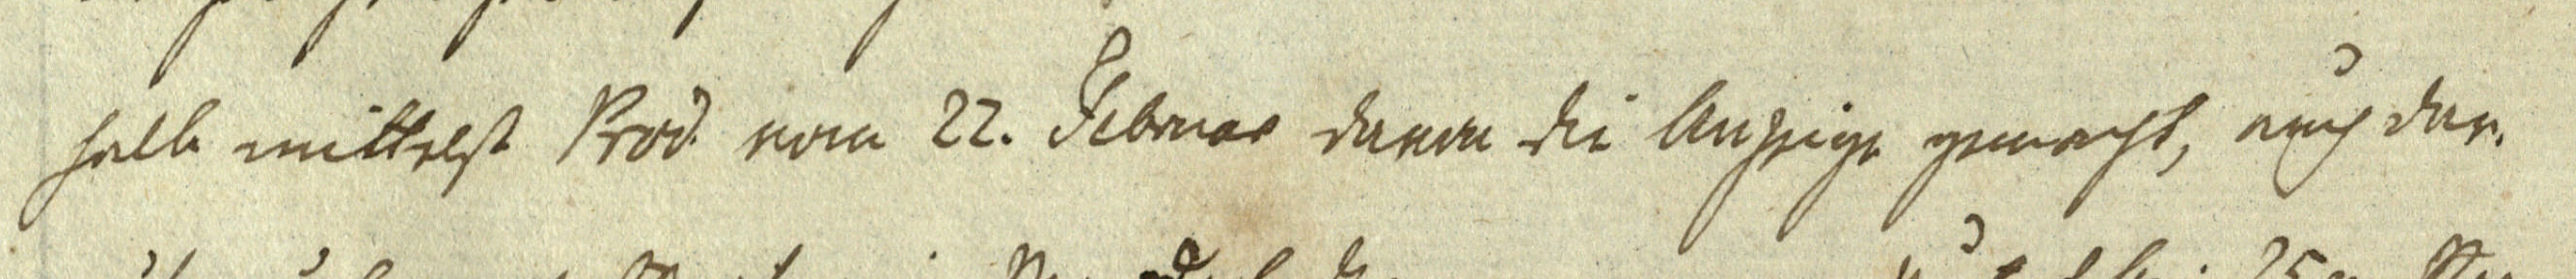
halb mittelst Prod. vom 22. Februar davon die Anzeige gemacht, auch dar¬
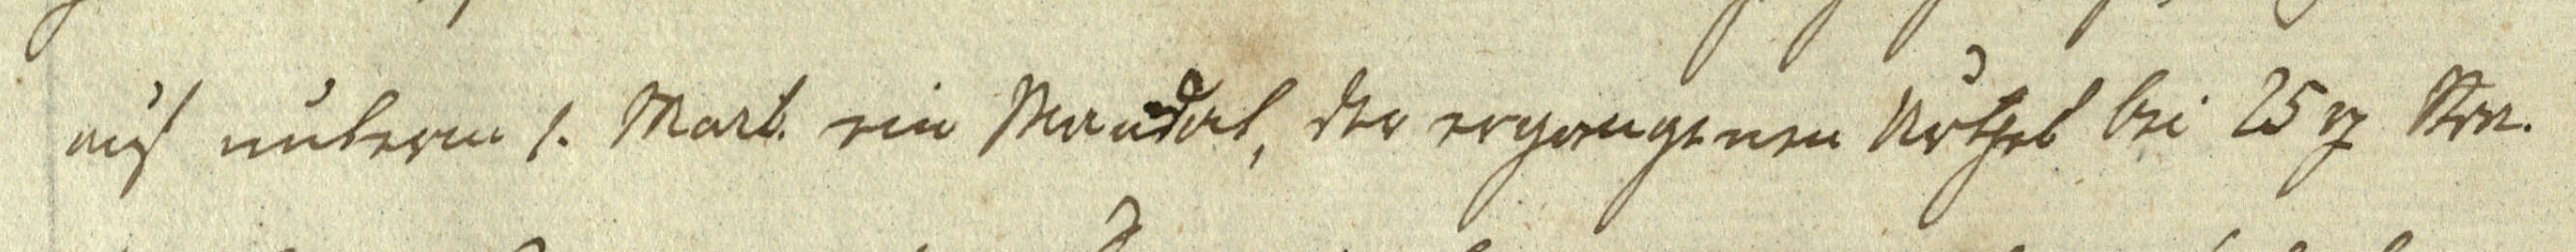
auf unterm 1. Mart ein Mandat, der ergangenen Urthel bei 25 rt Stra¬
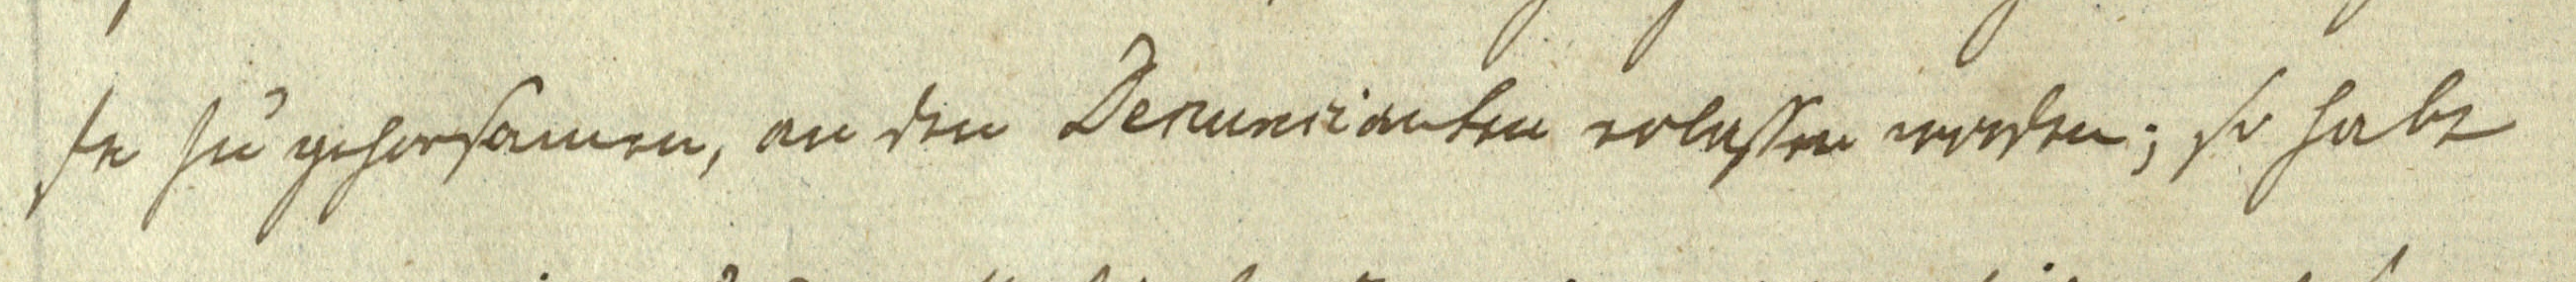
fe zu gehorsamen, an den Denuncianten erlassen worden; so habe
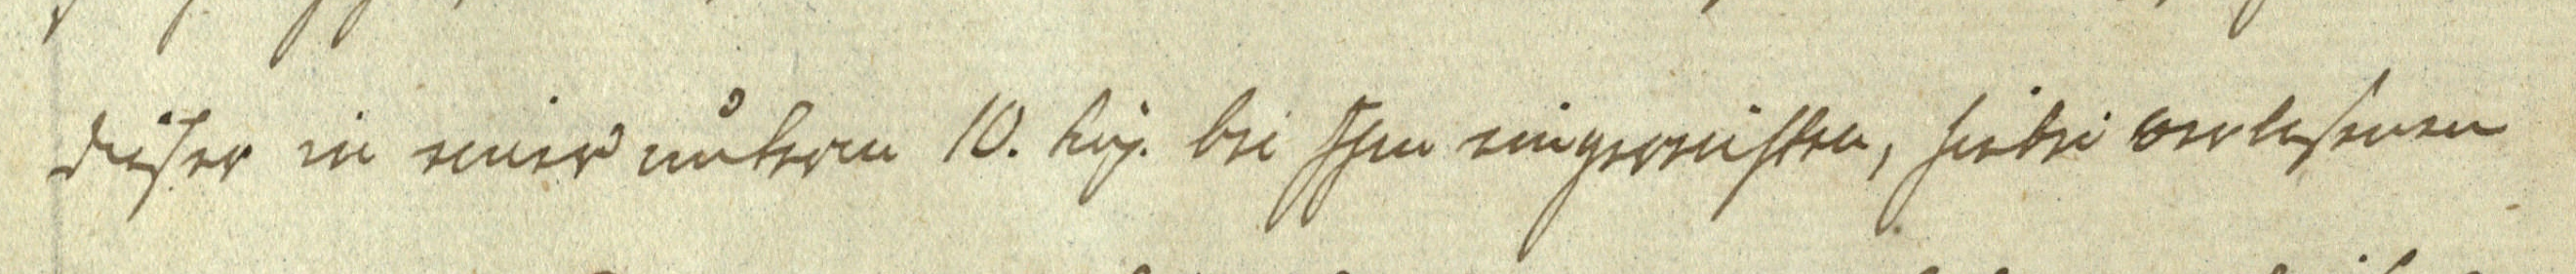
dieser in einer unterm 10. huj. bei Ihm eingereichten, hiebei verlesenen
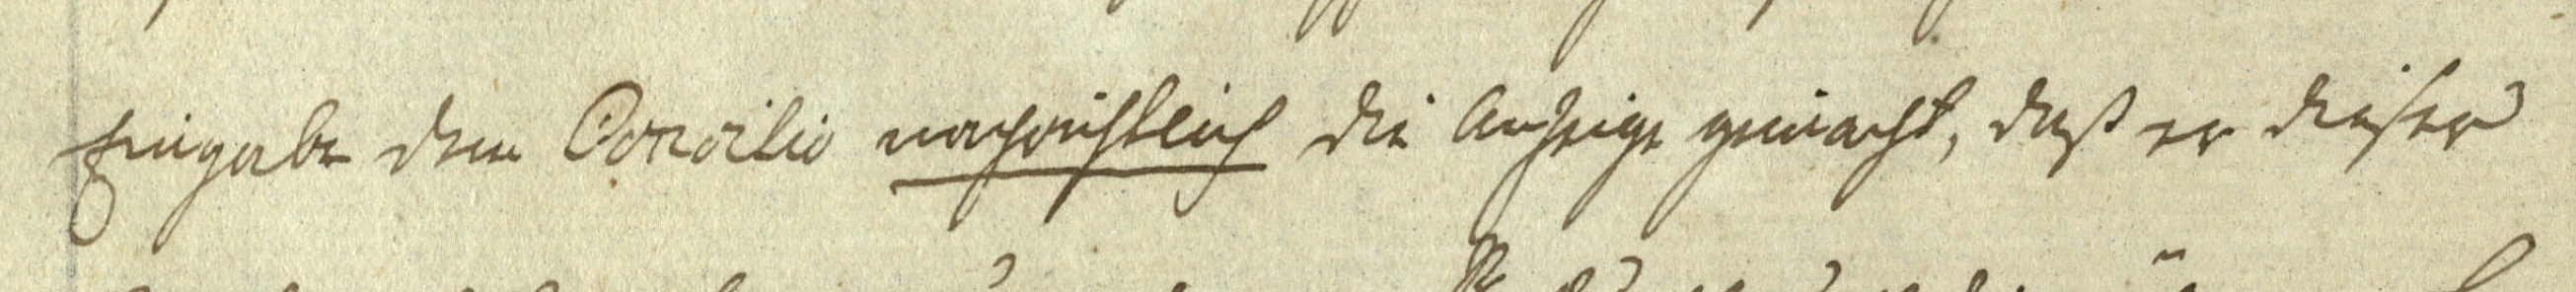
Eingabe dem Concilii nachrichtlich die Anzeige gemacht, daß er dieser
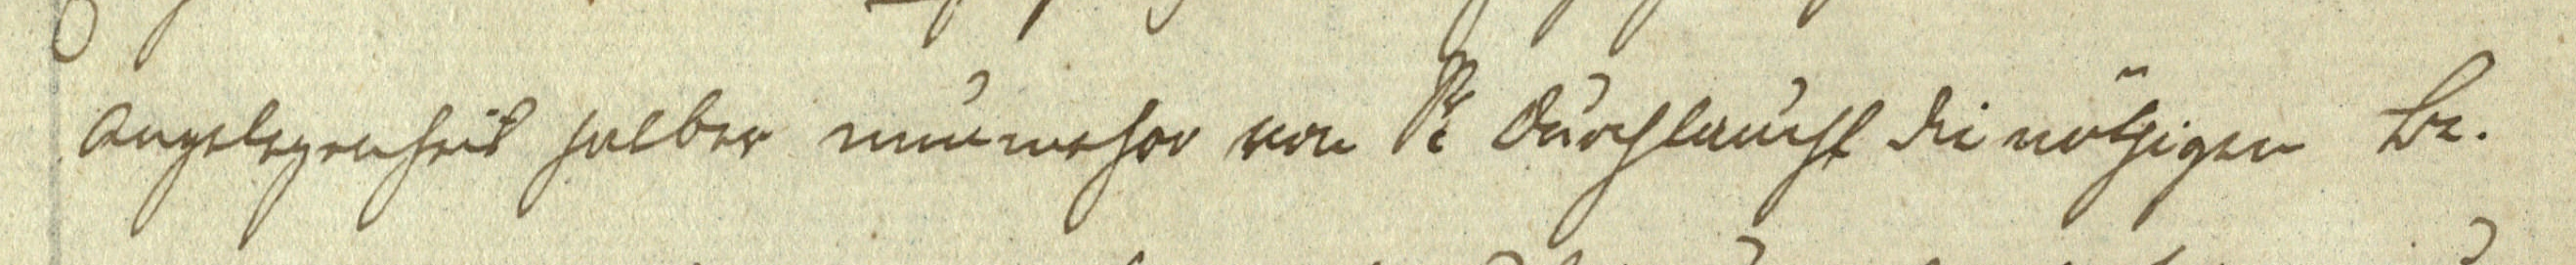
Angelegenheit halber nunmehro von Sr. Durchlaucht die nöthigen Be¬
